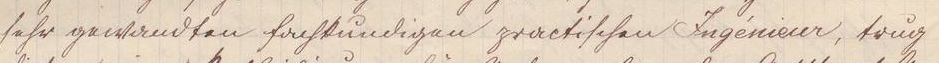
sehr gewandten fachkundigen practischen Ingénieur, trug
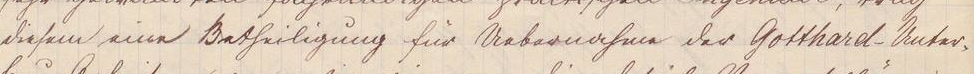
diesem eine Betheiligung für Uebernahme der Gotthard -Unter-
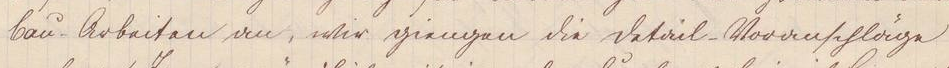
bau-Arbeiten an, wir giengen die Detail-Voranschläge
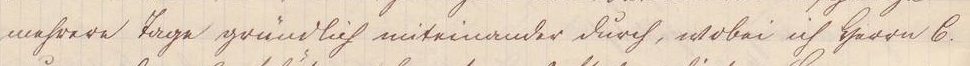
mehrere Tage gründlich miteinander durch, wobei ich Herrn C.
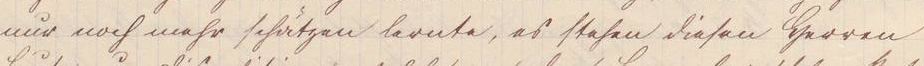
nur noch mehr schätzen lernte, es stehen diesen Herren
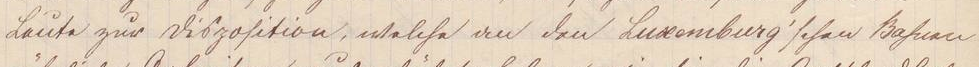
Leute zur Disposition, welche an den Luxemburg'schen Bahnen
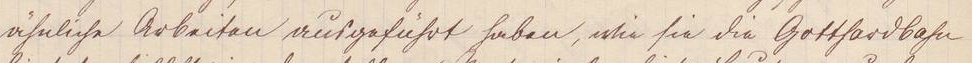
ähnliche Arbeiten ausgeführt haben, wie sie die Gotthardbahn
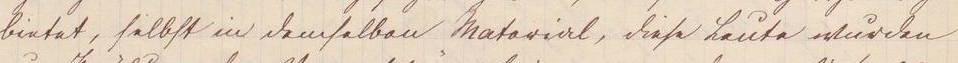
bietet, selbst in demselben Material, diese Leute wurden
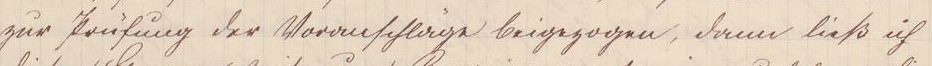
zur Prüfung der Voranschläge beigezogen, dann ließ ich
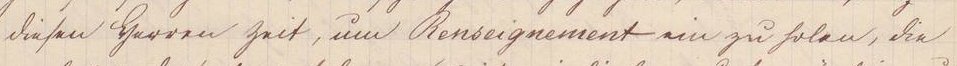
diesen Herren Zeit, um Renseignement ein zu holen, die
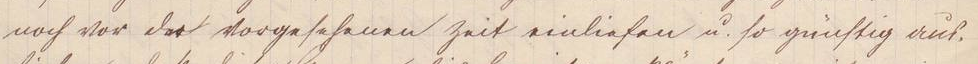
noch vor der vorgesehenen Zeit einliefen u. so günstig aus-
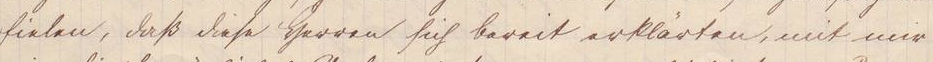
fielen, daß diese Herren sich bereit erklärten, mit mir
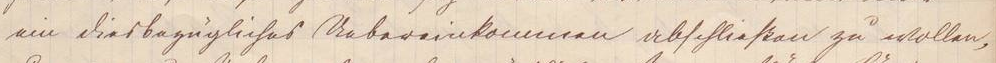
ein diesbezügliches Uebereinkommen abschließen zu wollen
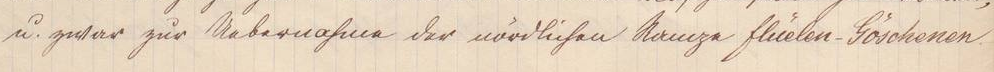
u. zwar zur Uebernahme der nördlichen Rampe Flüelen–Göschenen
